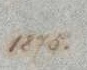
27. Februar
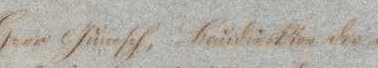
Herr Gunesch, Baudirektor der
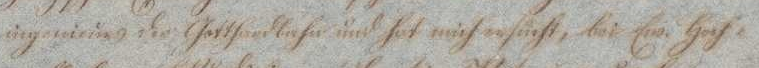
ingenieurs der Gotthardbahn und hat mich ersucht, bei Ew. Hoch-
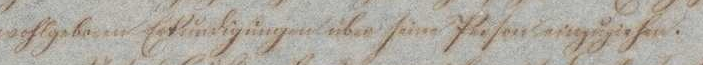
wohlgeboren Erkundigungen über seine Person einzuziehen.
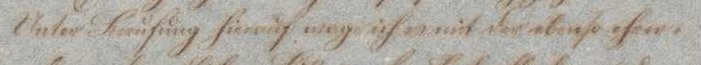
Unter Berufung hierauf wage ich es mit der ebenso ehrer-
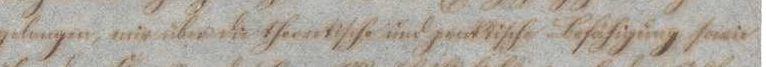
gelangen, mir über die theoretische und praktische Befähigung sowie
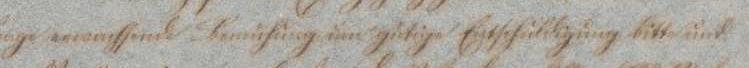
frage erwachsende Bemühung um gütige Entschuldigung bitte und
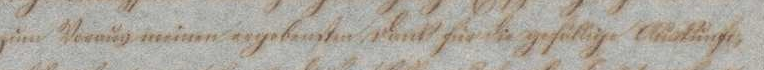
zum Voraus meinen ergebensten Dank für die gefällige Auskunft,
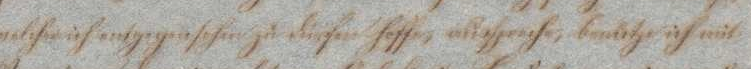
welcher ich entgegensehen zu dürfen hoffe, ausspreche, benütze ich mit
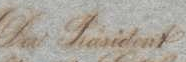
Der Präsident
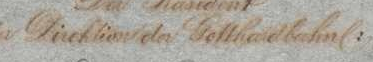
Direktion der Gotthardbahn:
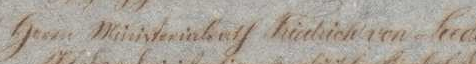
Herrn Ministerialrath Friedrich von Leeder,
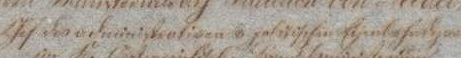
Chef des administrativen & politischen Eisenbahndepartements
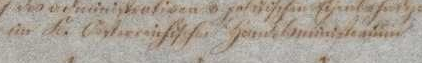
im K. Oesterreichischen Handelsministerium
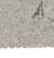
etc.
